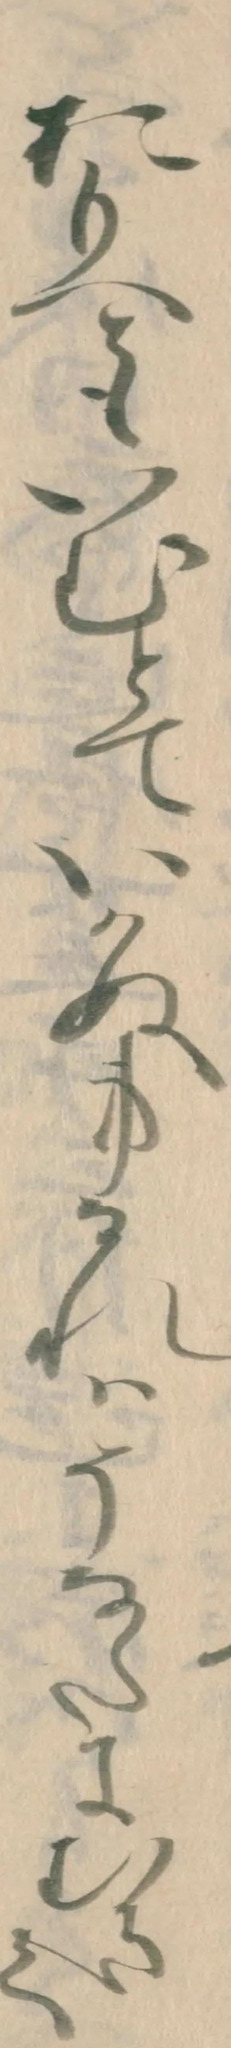おもへともいむとていはぬ事なれはそなたにむきて
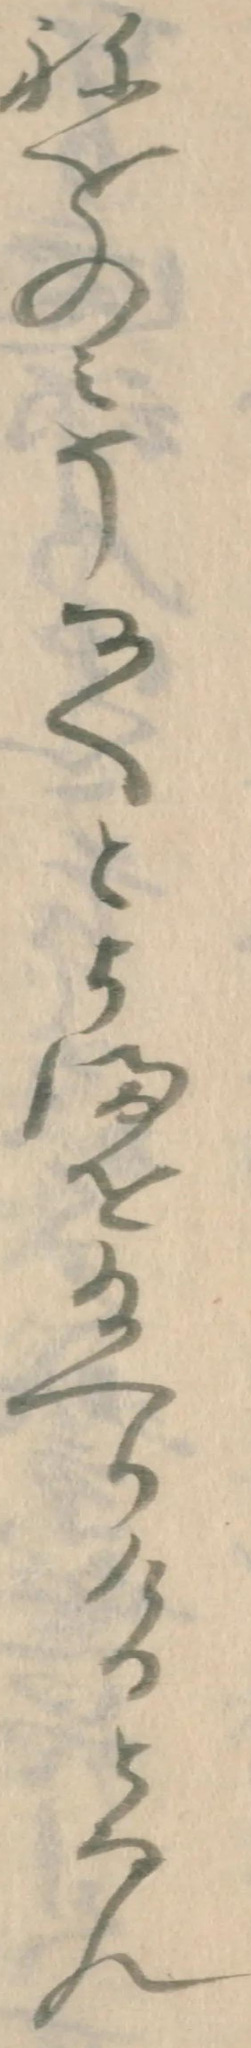ねをのみそなくとよませ給へりけるとなん

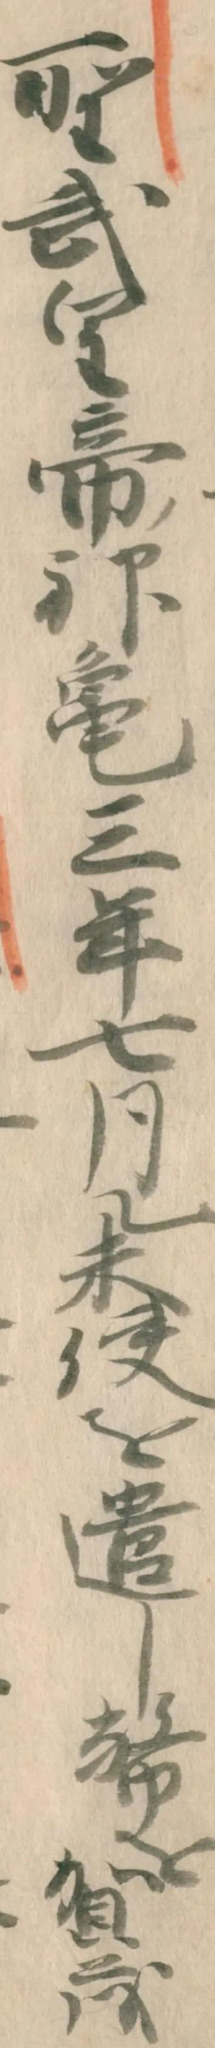聖武皇帝神亀三年七月乙未使を遣し幣を賀茂
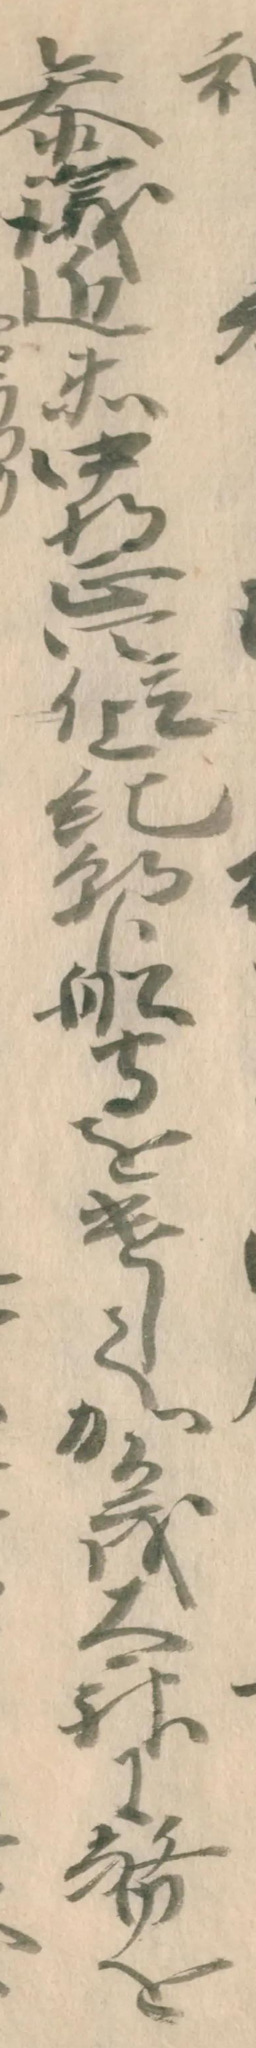参議近衛中将正四位上紀朝臣船守を遣して賀茂太神に幣を
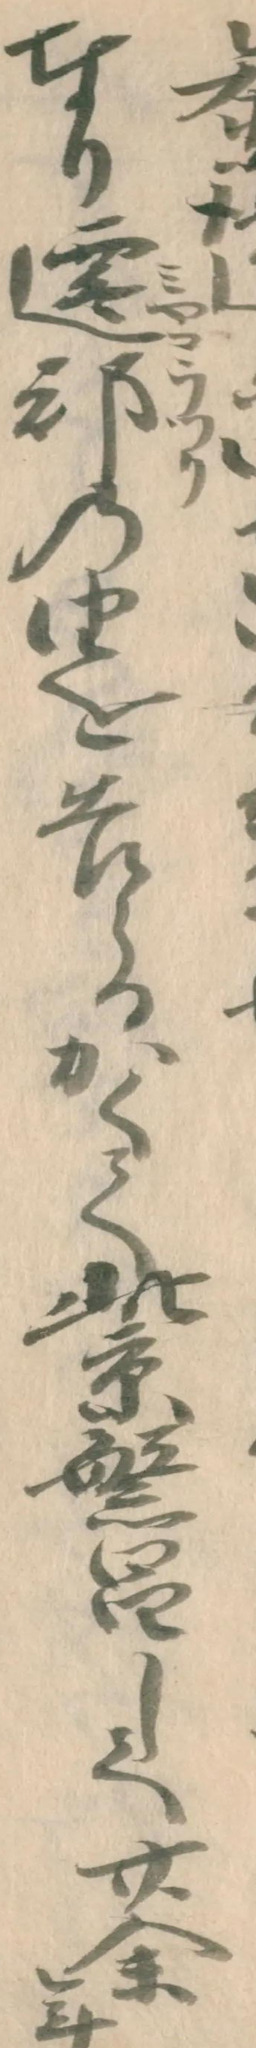奉り遷都の由を告らるかくて此京繁昌して廿余年
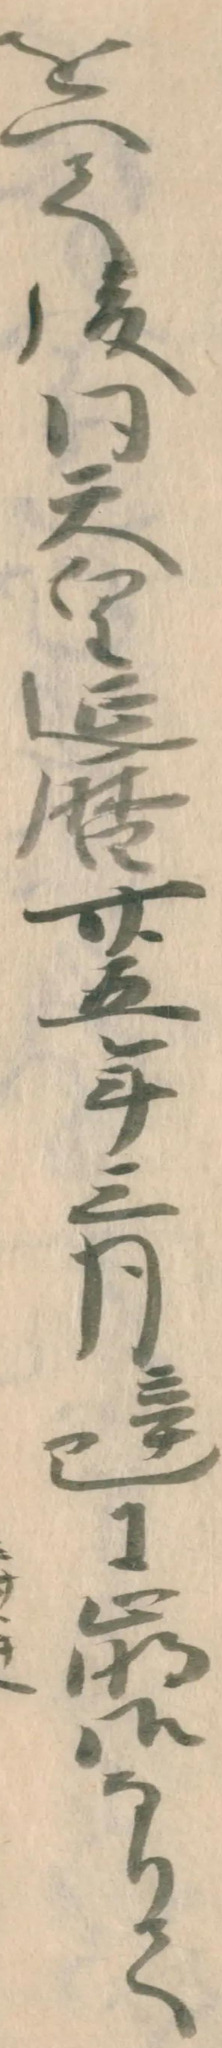をへて後同天皇延暦廿五年三月辛巳に崩御なりて
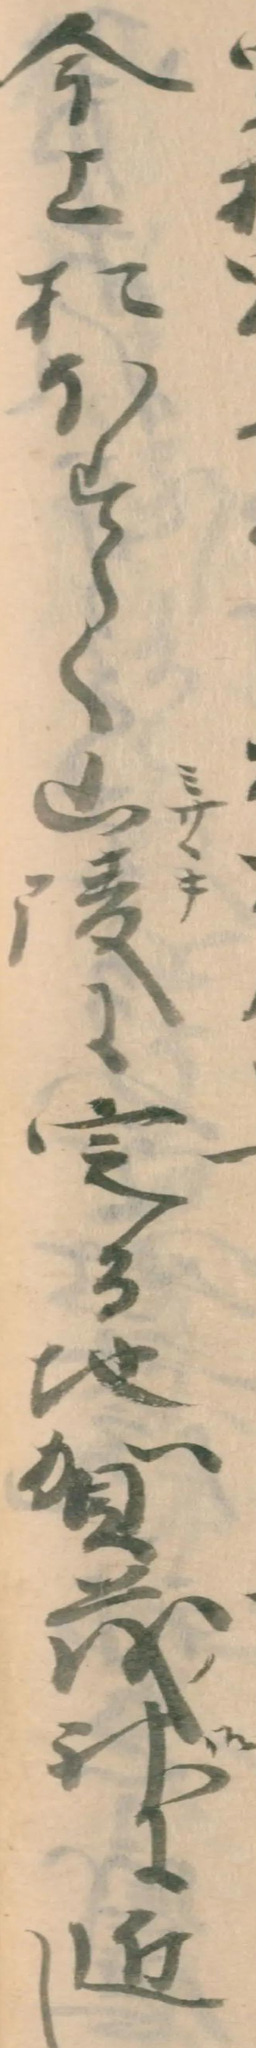今上おほすらく山陵に定る地賀茂◦神に近し
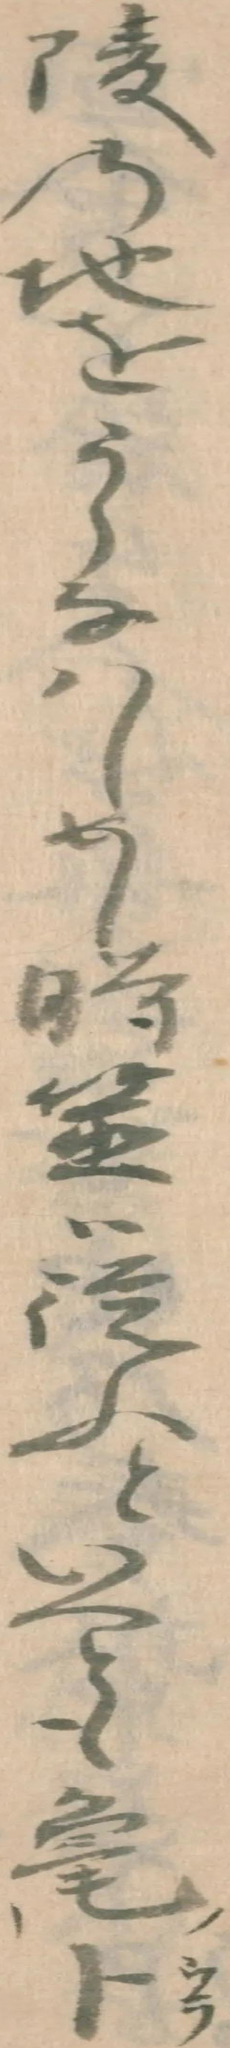陵の地をうらなはしめし時筮は従ふといへとも亀-卜
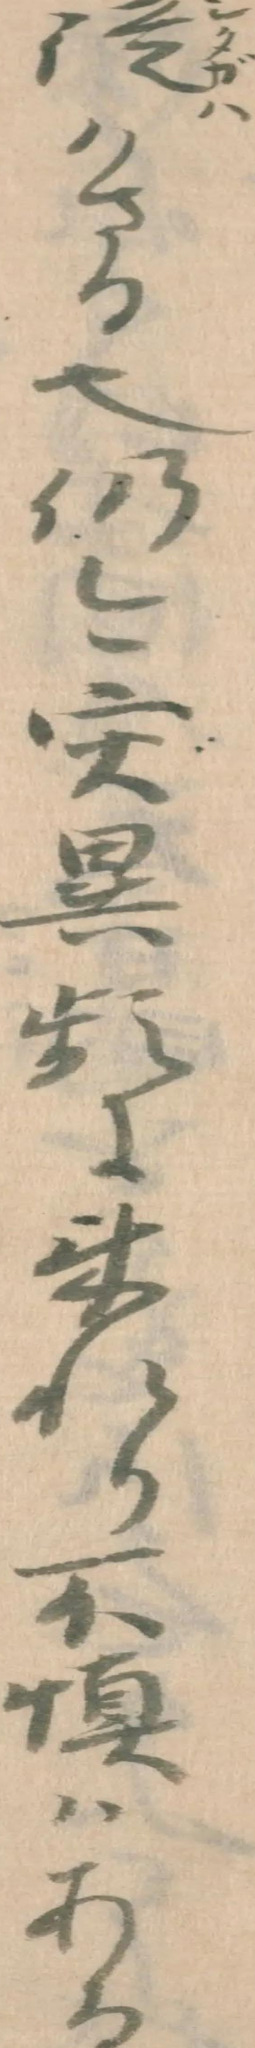従はさる也仍今灾異頻に来れり不慎はある
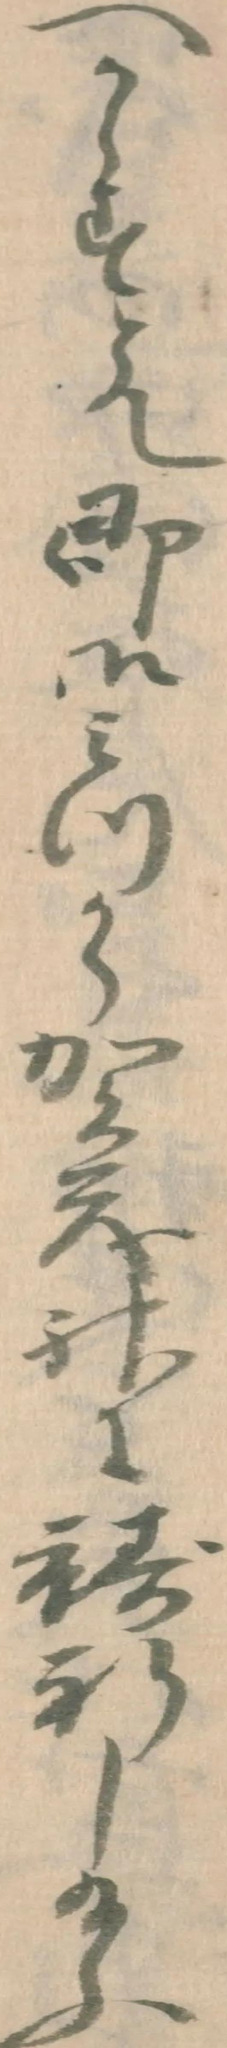へからすとて即御みつから賀茂神に祷祈し給ふ
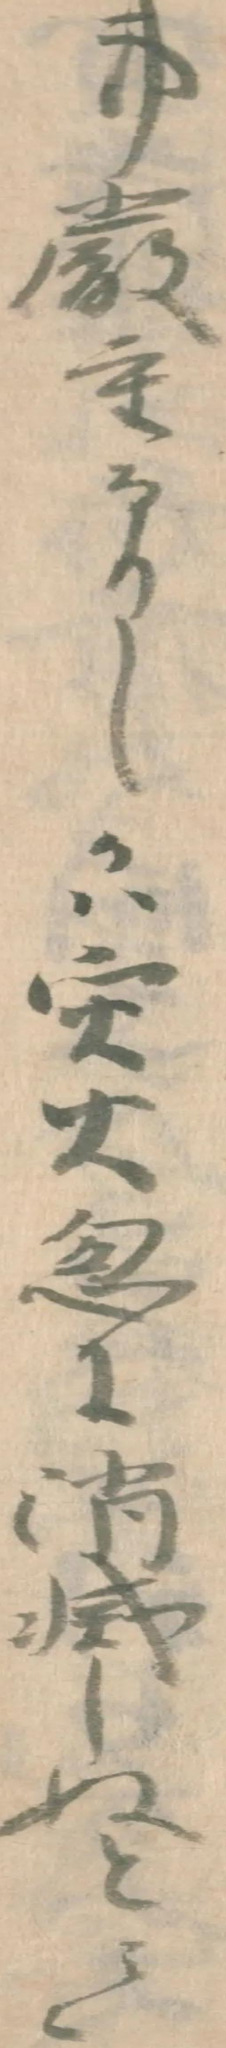事厳重なりしかは灾火忽に消滅しぬと云々
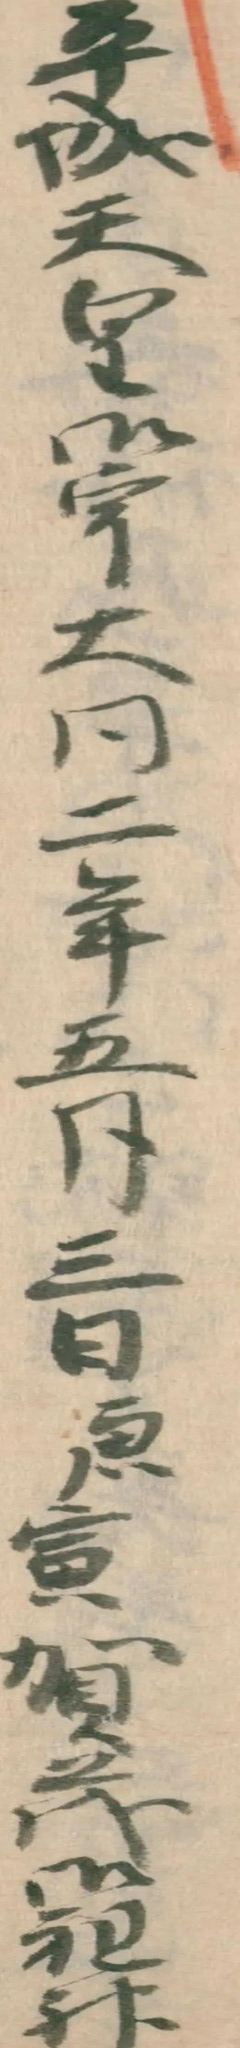平城天皇御宇大同二年五月三日庚寅賀茂御祖神
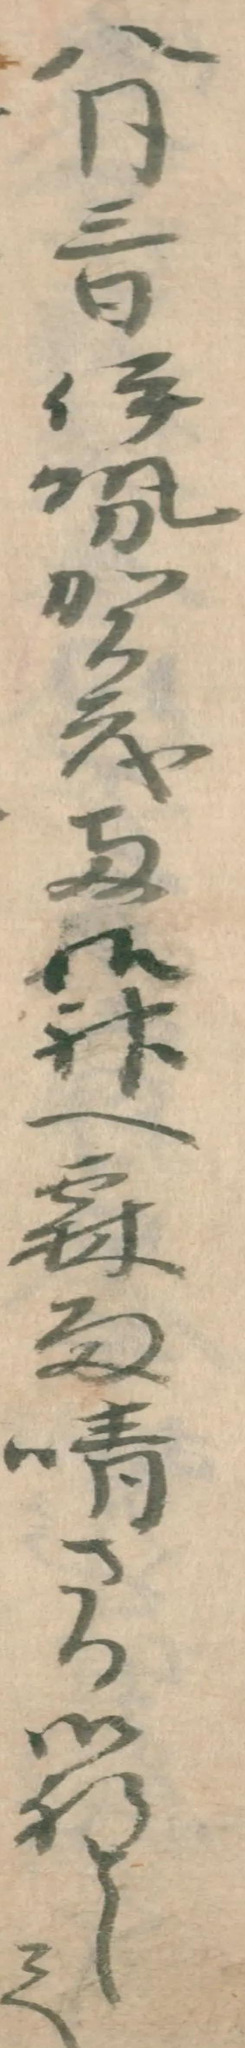八月三日伊勢賀茂両御神へ霖雨晴さる御祈として

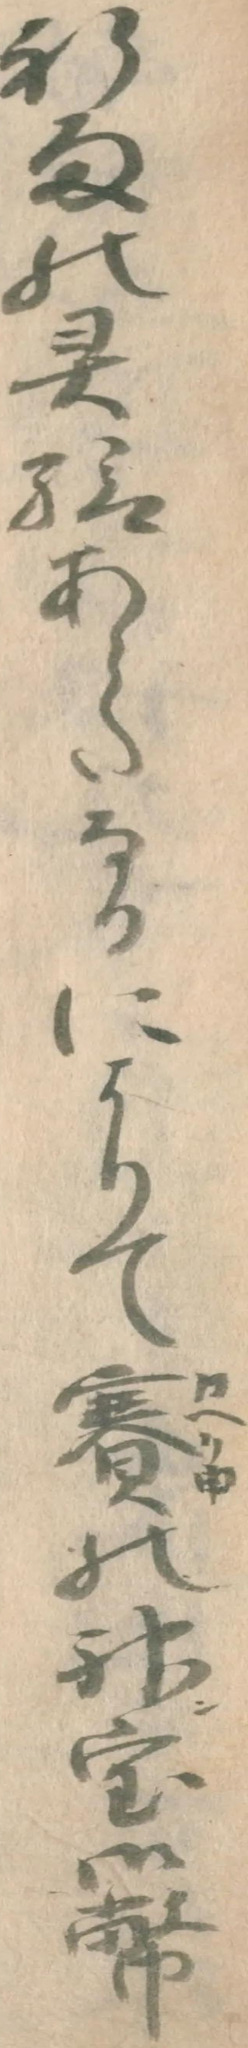祈雨の霊験あらたなるによりて賽の神宝御幣
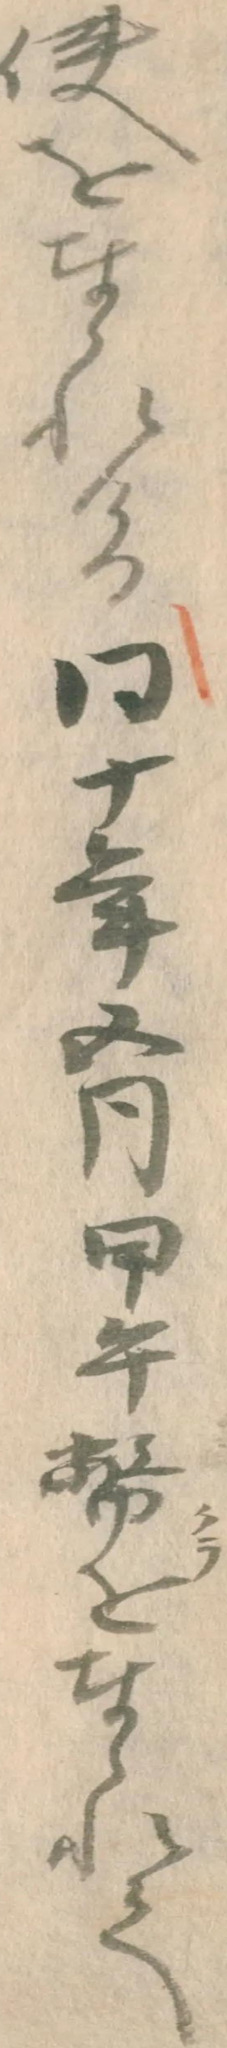使を奉られける同十年五月甲午幣奉られて
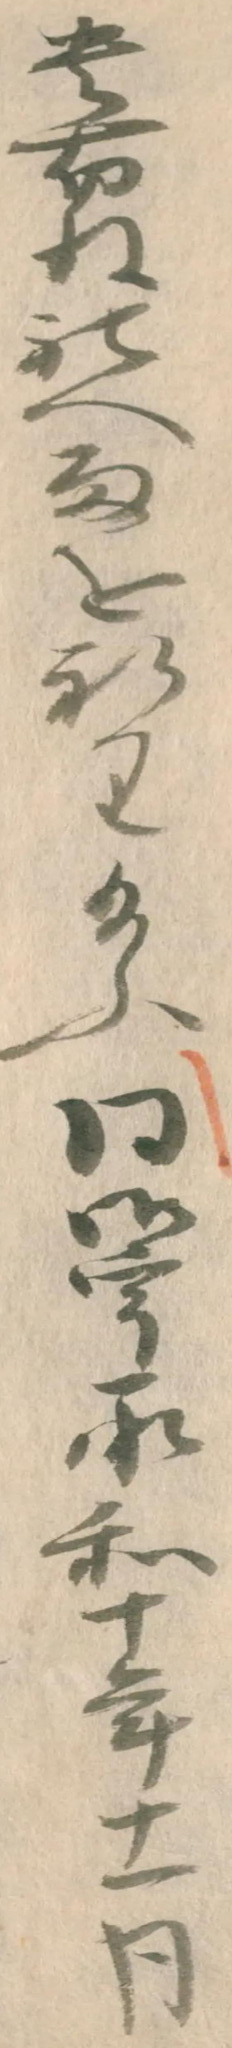貴ふね社へ雨を祈り給ふ同御宇承和十年十一月
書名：賀茂社記録. 第1冊
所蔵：国立国会図書館 National Diet Library, JAPAN
